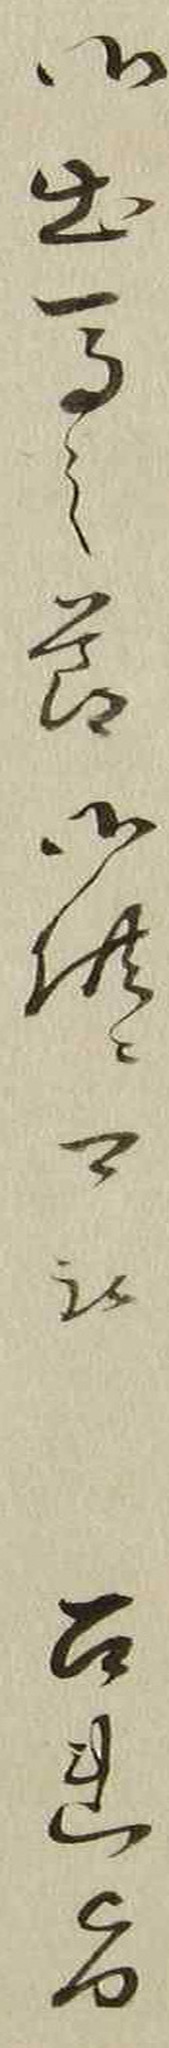御出馬之節御供ニ可被召連旨
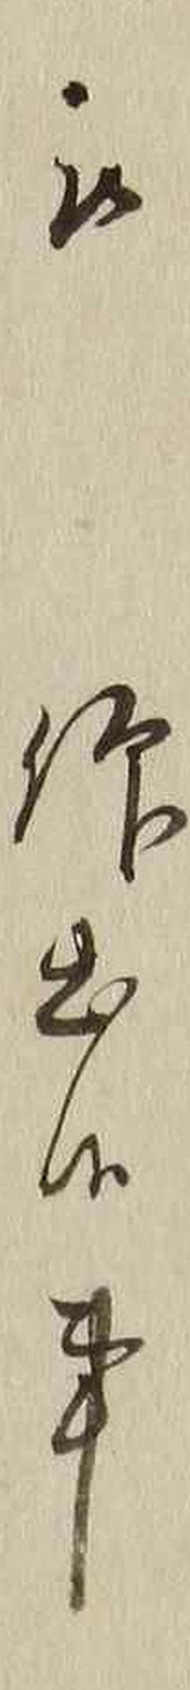被仰出候事
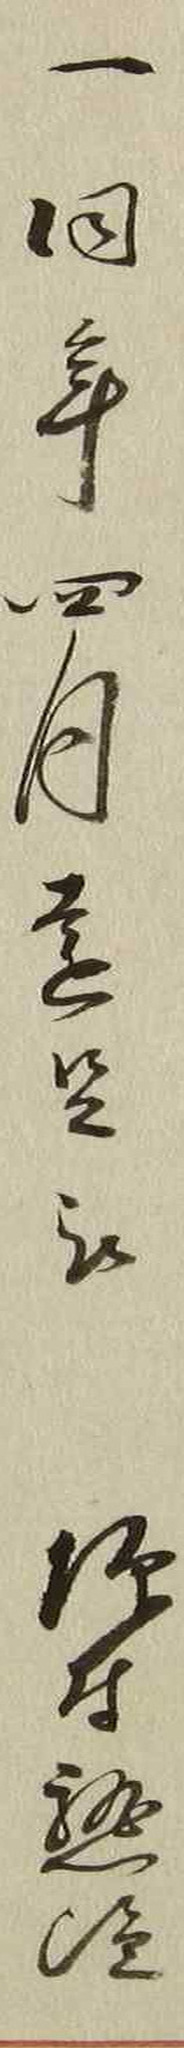一同年四月道足被仰付熟頃
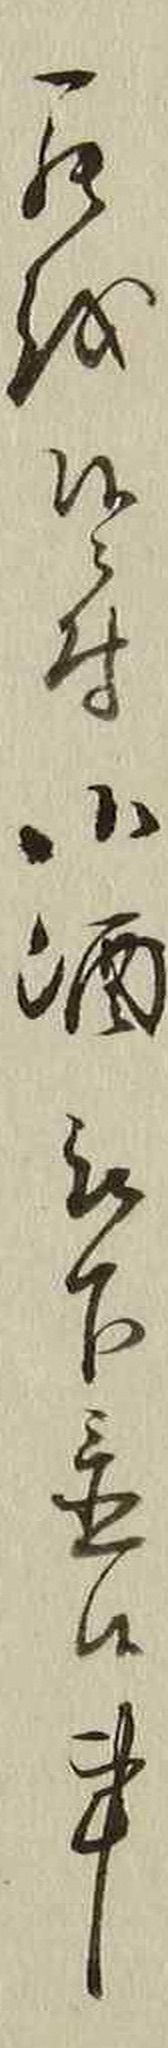罷越候ニ付御酒被下置候事
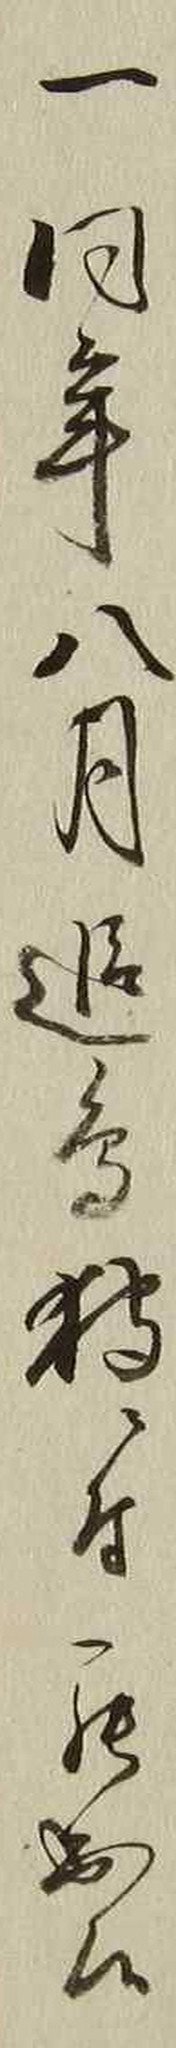一同年八月追鳥狩ニ付罷出候
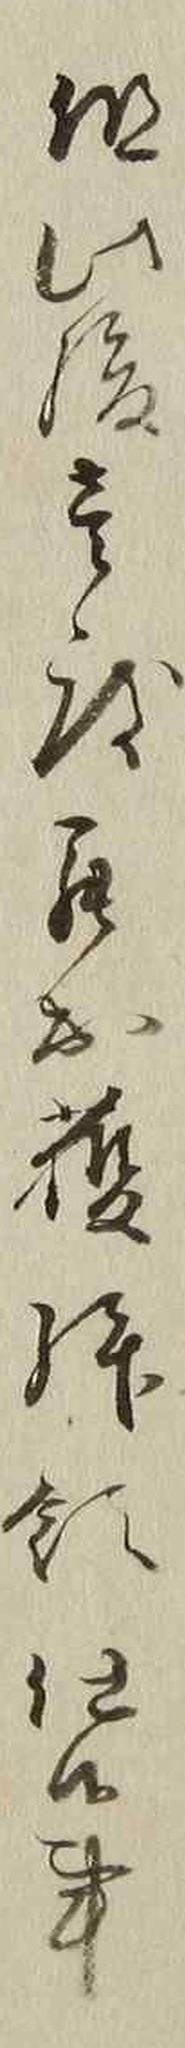但此後壱度罷成獲拝領仕候事
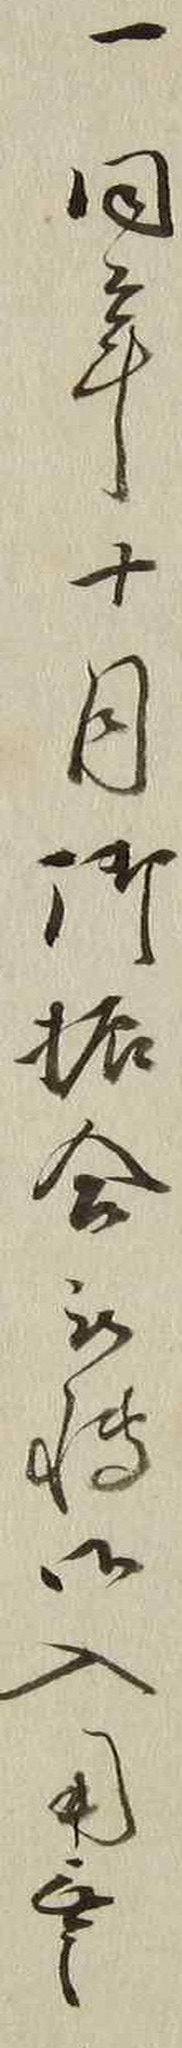一同年十月御振合被伝御入用無之
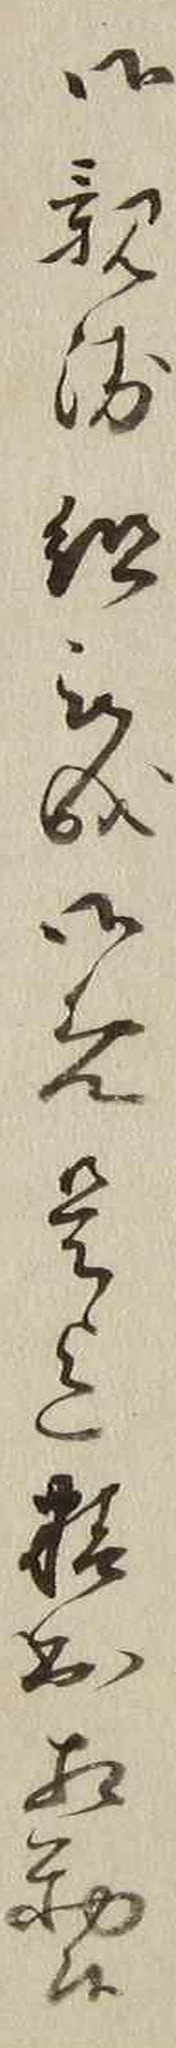御親衛組被成御免是迄精出相勤候
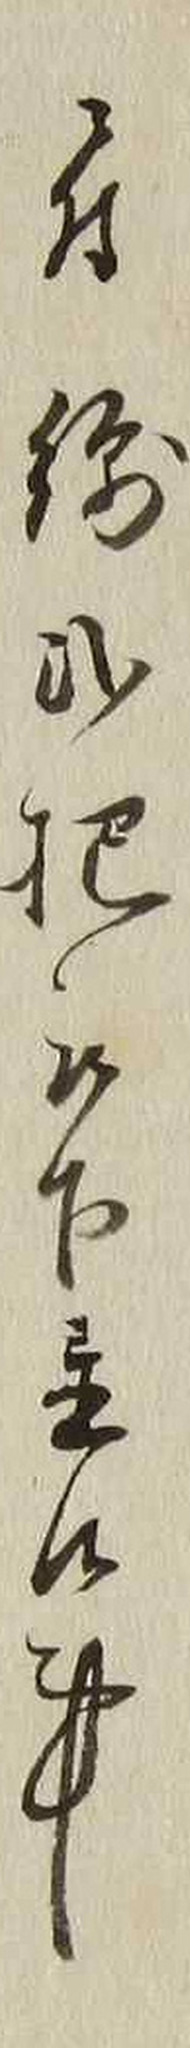ニ付綿弐把被下置候事
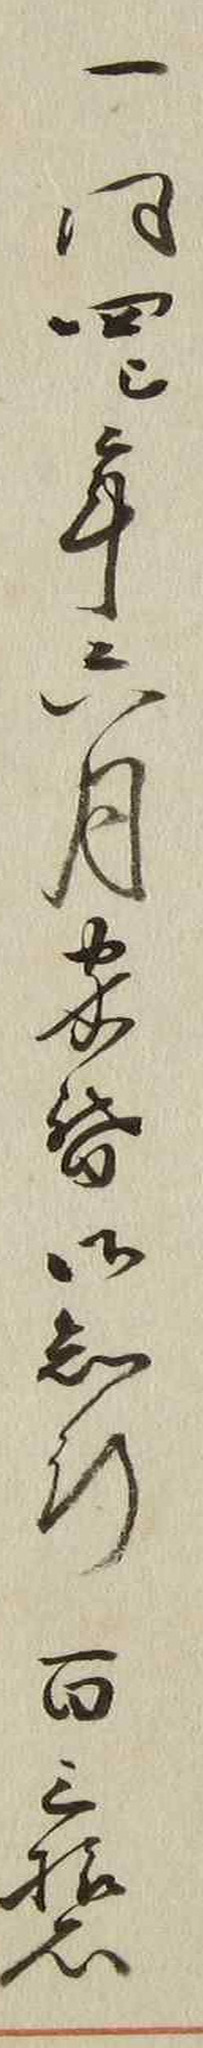一同四巳年六月家督御知行百三拾石
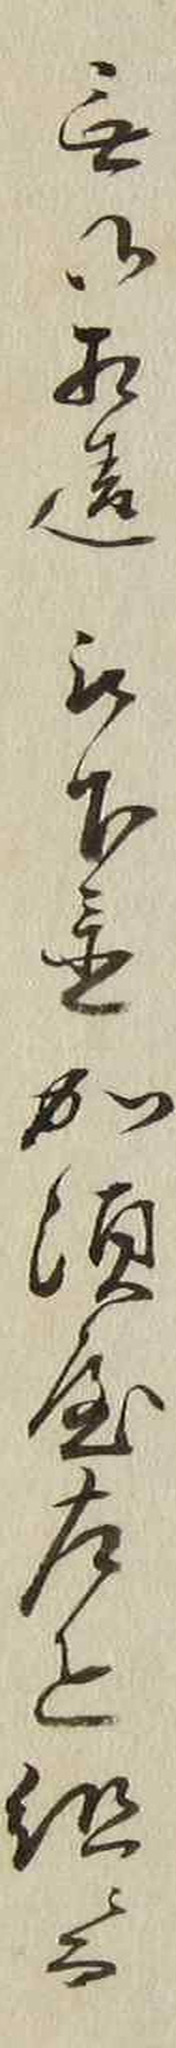無御相違被下置加須屋左近組ニ而
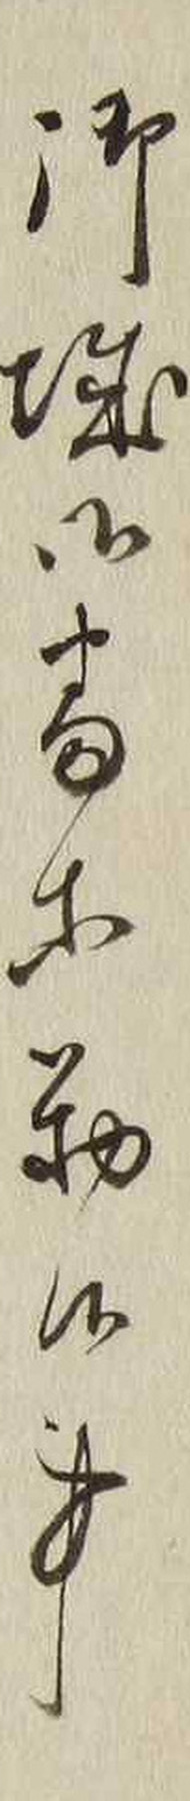御城御番等勤候事
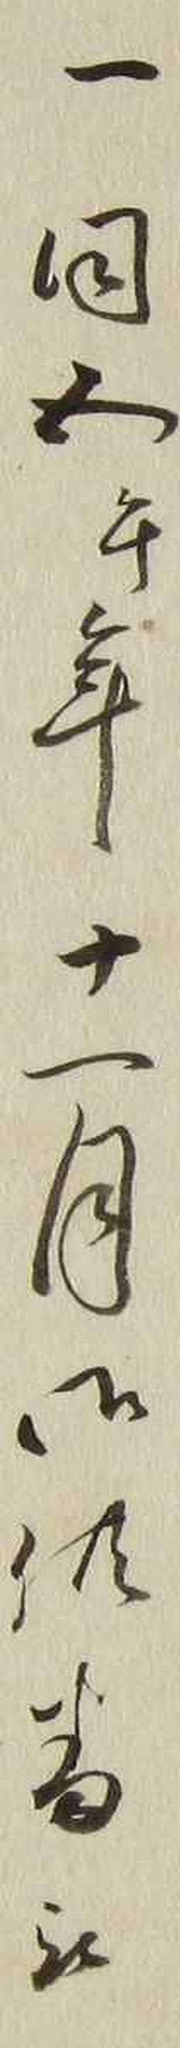一同五午年十一月御供番被
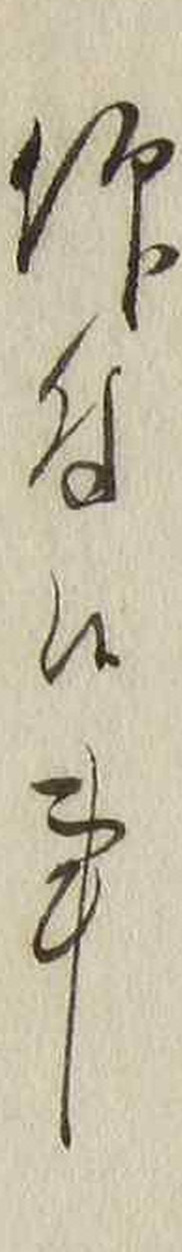仰付候事
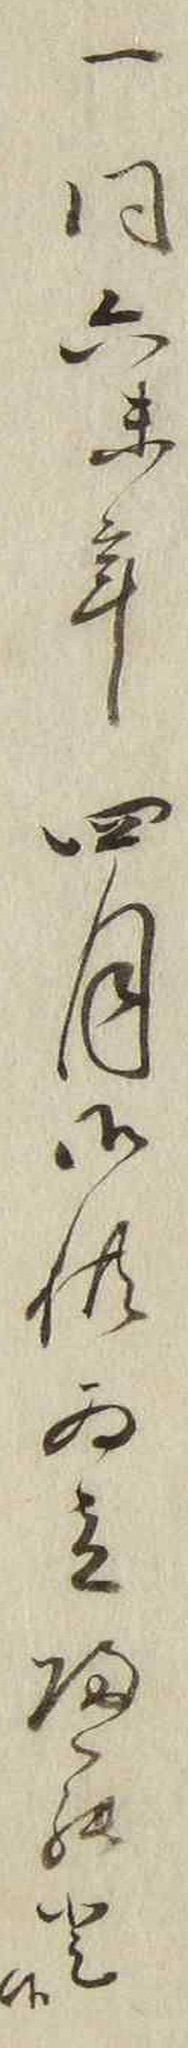一同六未年四月御供為立備罷登候

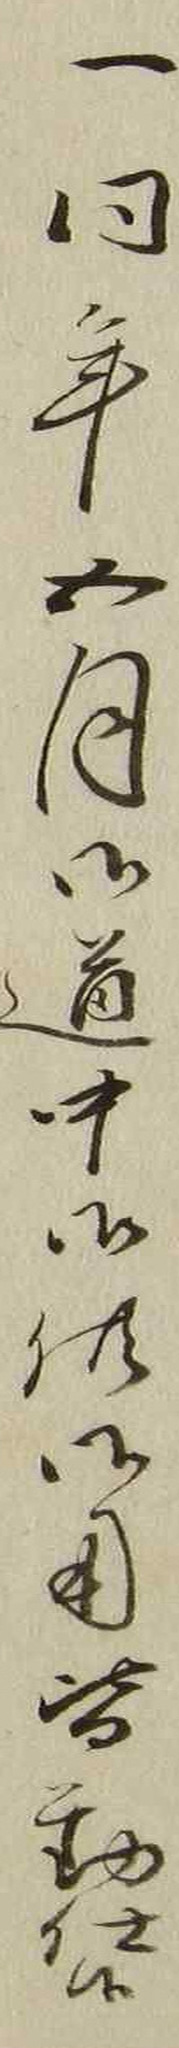一同年五月御道中御供御用替勤仕候
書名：諸士系譜　巻之52　に之部3
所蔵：会津若松市立会津図書館
